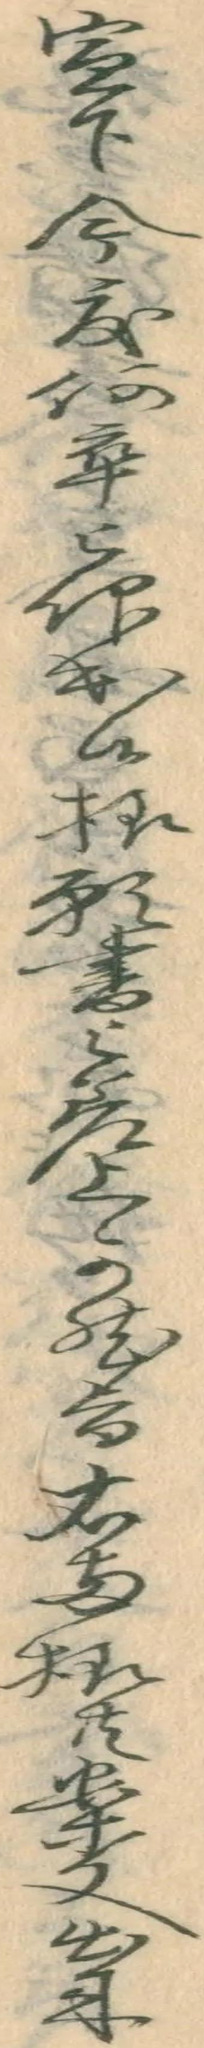宣下今度何卒被仰出候様願書被差上候可然旨右両様共案文出来

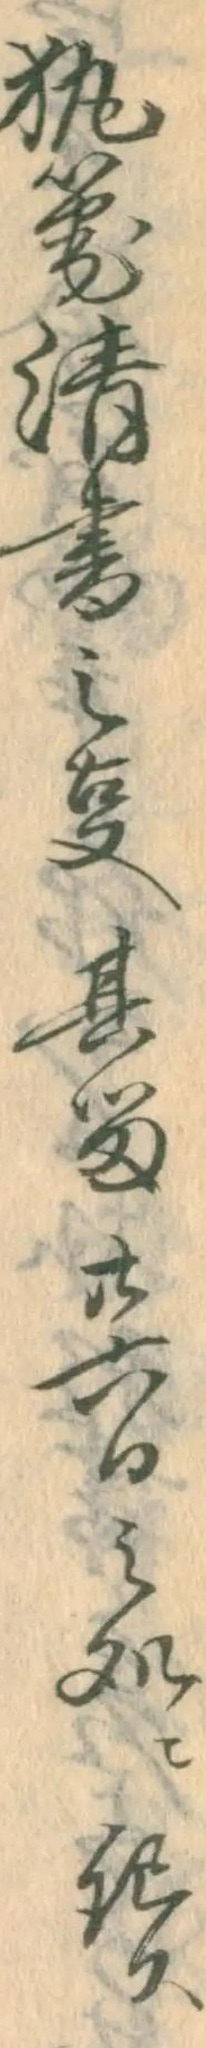執筆清書之事其留廿六日之処ニ記ス
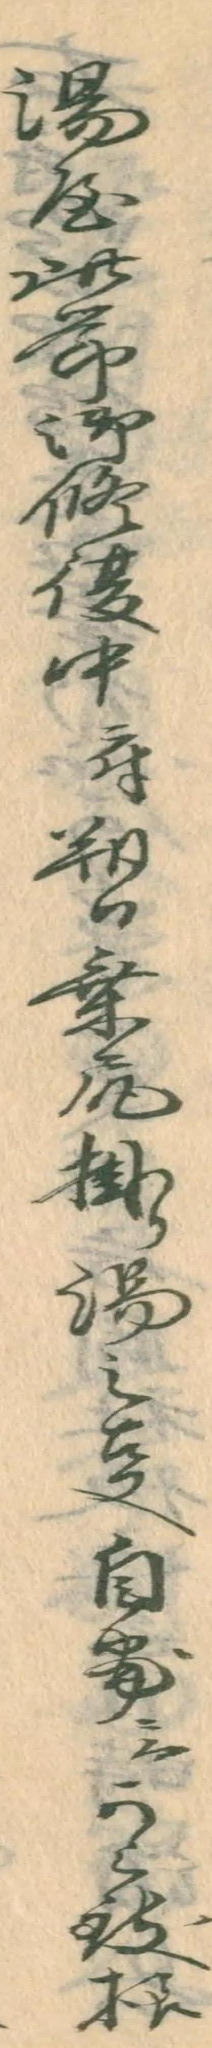一湯屋此節御修復中ニ付朔日乗尻掛り湯之事自宅ニ而可被致様
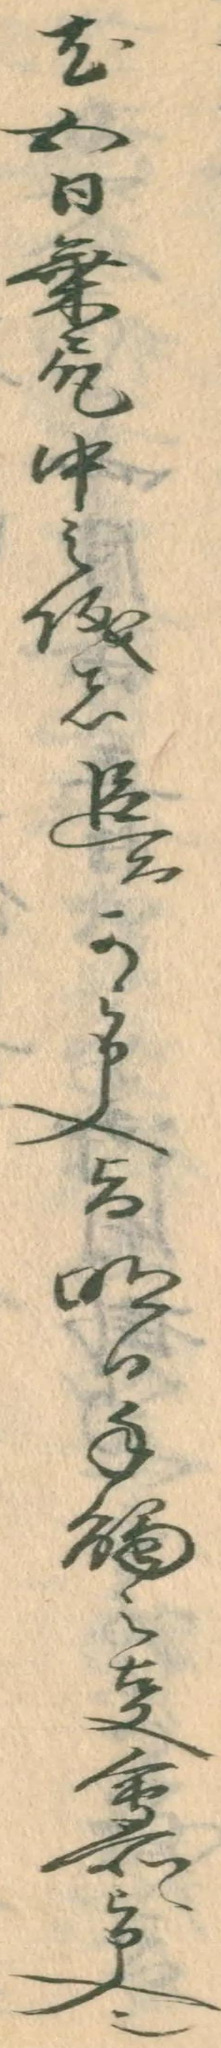尤五日乗尻中之儀は追而可被申入旨明日手触之事会所被申入也
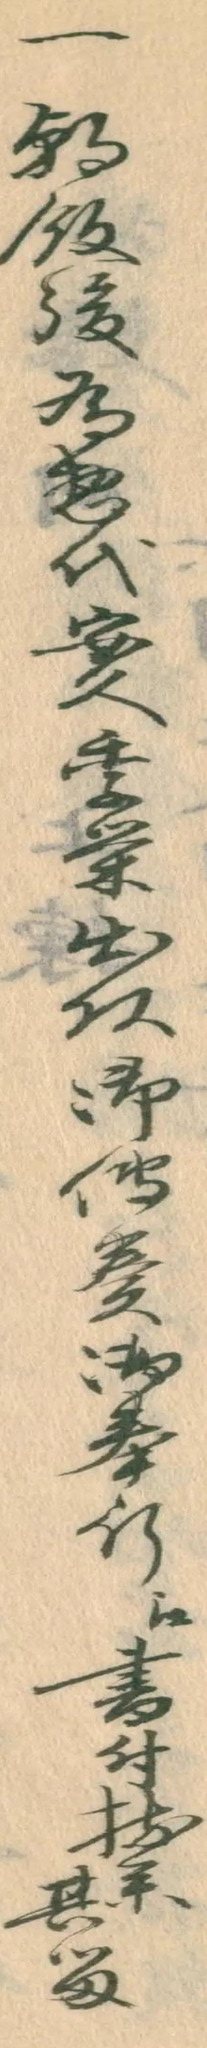一朝飯後為惣代安久季栄出頭御伝奏御奉行江書付持参其留
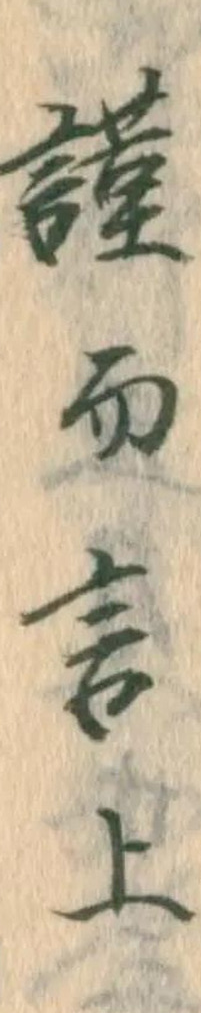謹而言上
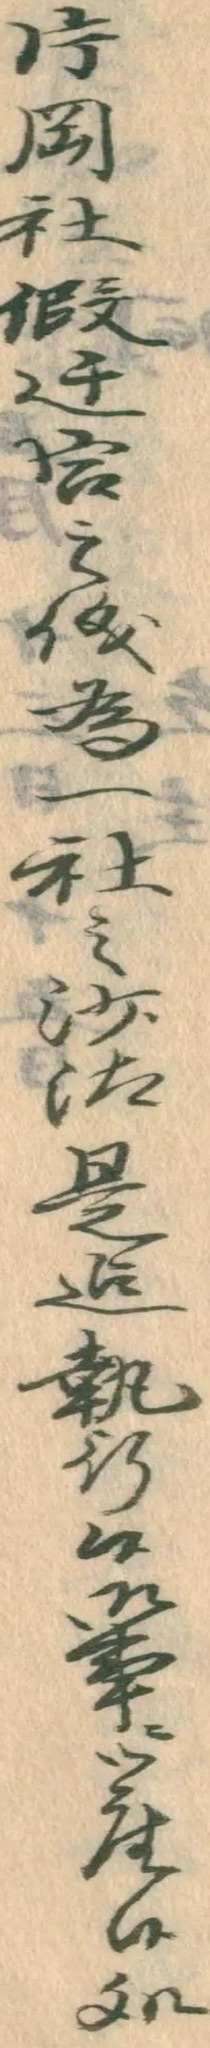片岡社仮迁宮之儀為一社之沙汰是迄執行候御事ニ御座候処
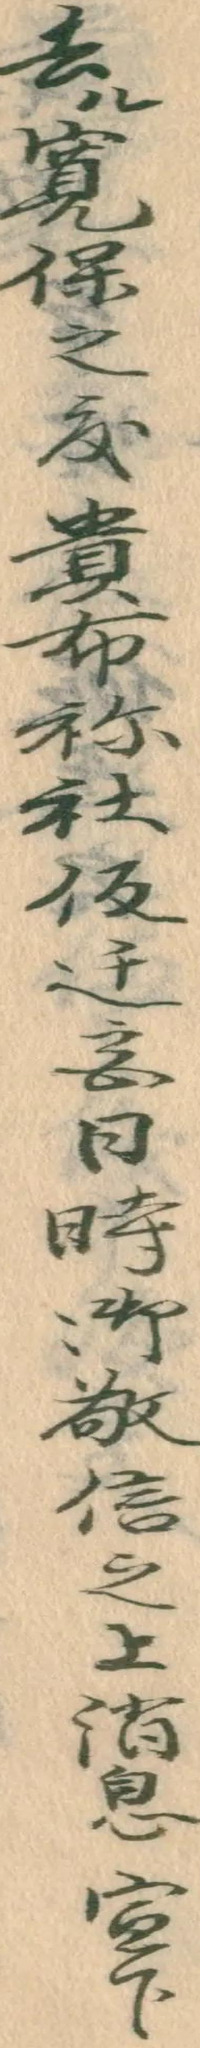去ル寛保之度貴布祢社仮迁宮日時御敬信之上消息宣下
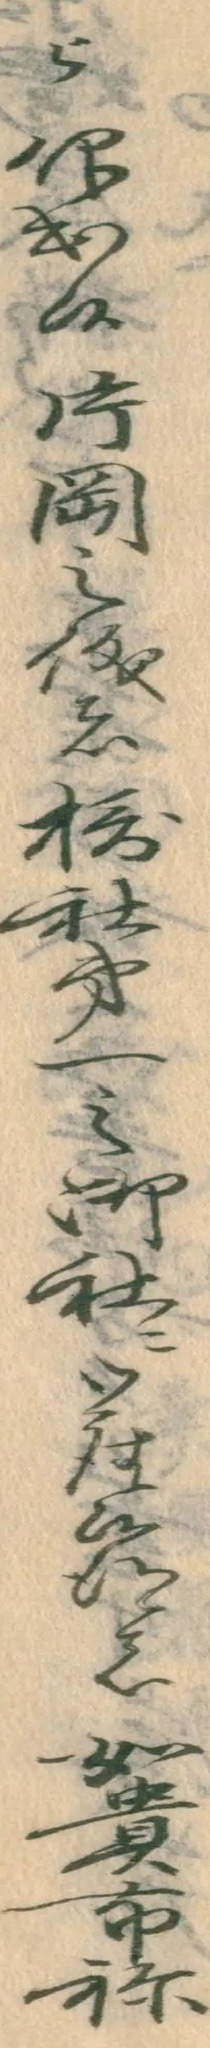被仰出候片岡之儀は摂社第一之御社ニ御座候得は如貴布祢
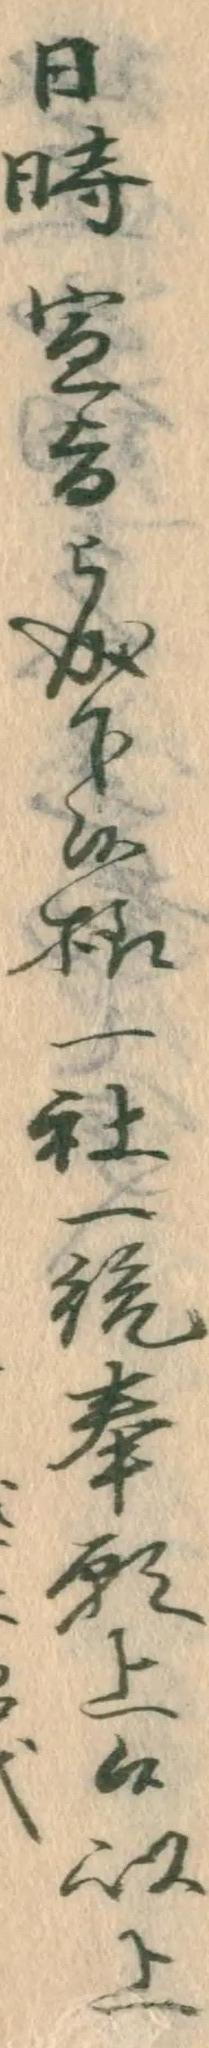日時宣旨被成下候様一社一統奉願上候以上
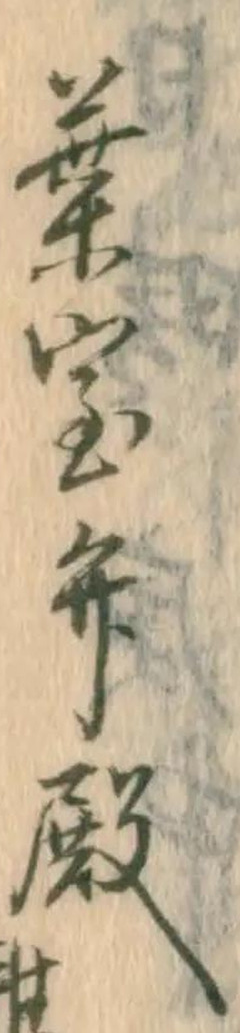葉室弁殿
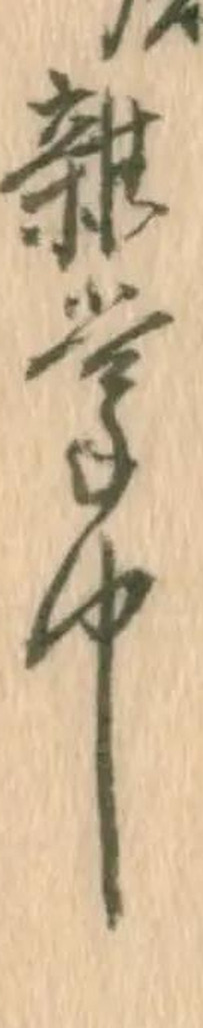雑掌中
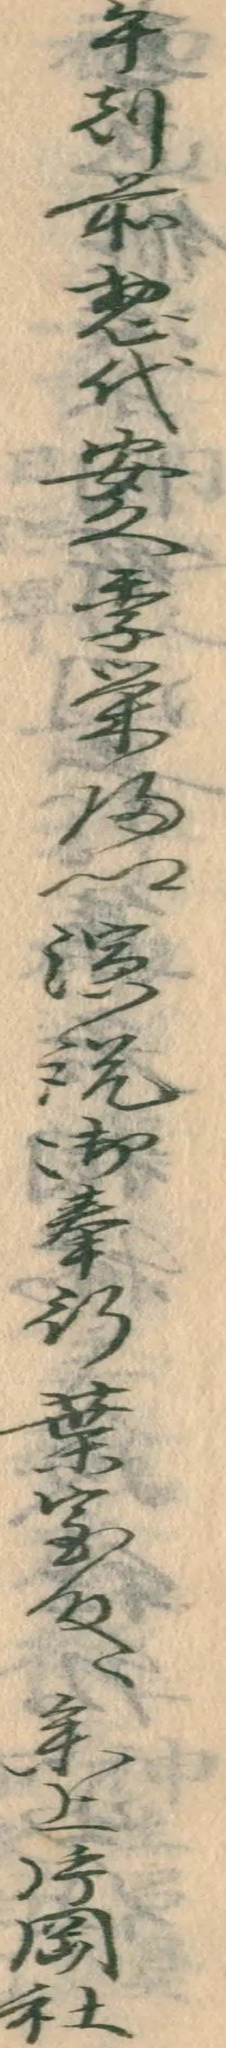午刻前惣代安久季栄帰郷演説御奉行葉室殿へ参上片岡社
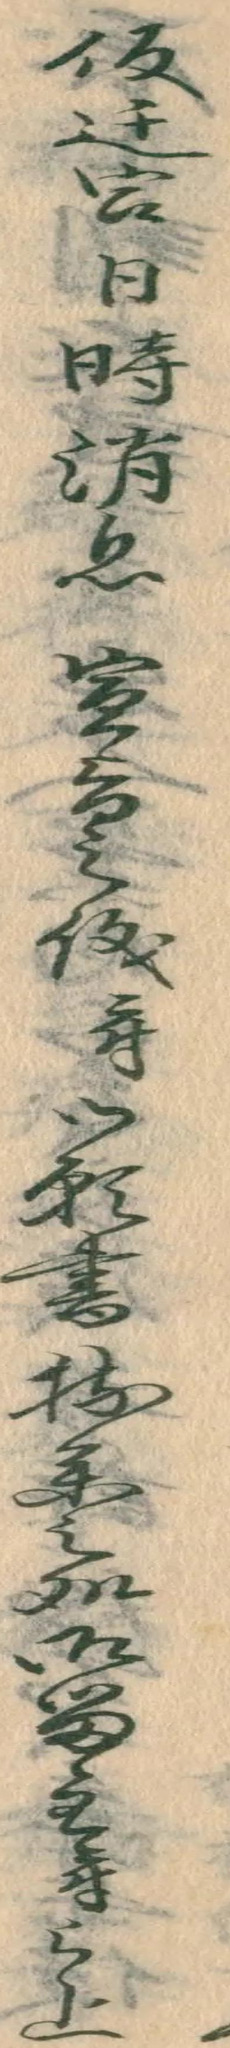仮迁宮日時消息宣旨之儀ニ付御願書持参之処御留守ニ付被上
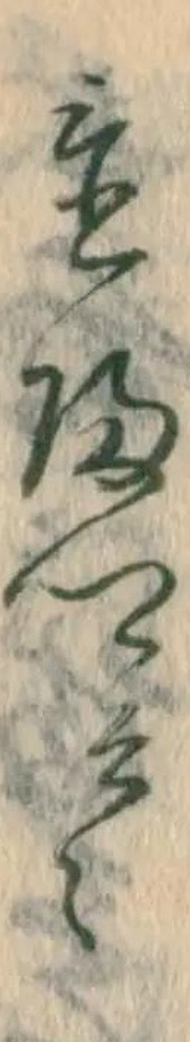置帰郷云々
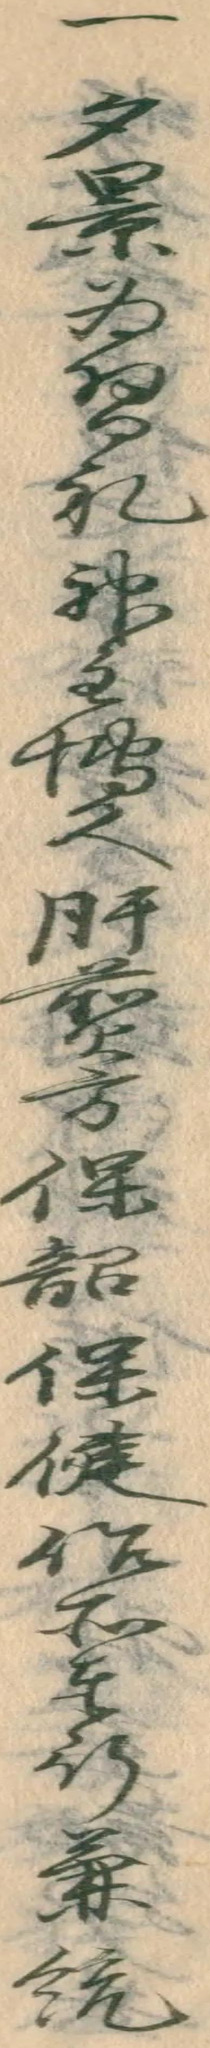一夕景為習礼神主博久肝煎方保韶保健作所奉行兼統
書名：賀茂社記録. 第17冊
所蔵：国立国会図書館 National Diet Library, JAPAN
